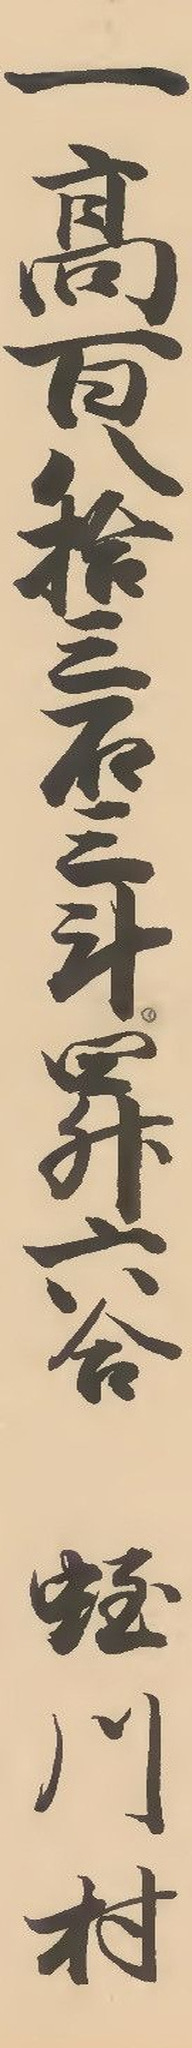一高百八拾三石三斗四升六合蛭川村
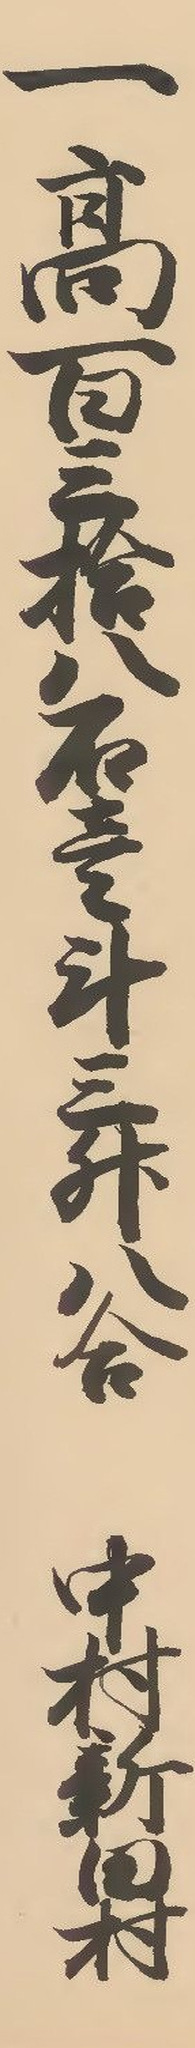一高百三拾八石壱斗三升八合中村新田村
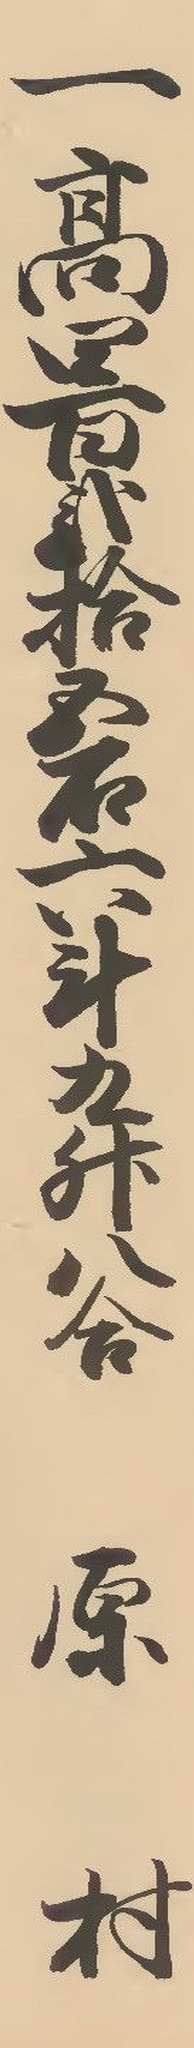一高四百弐拾五石六斗九升八合原村
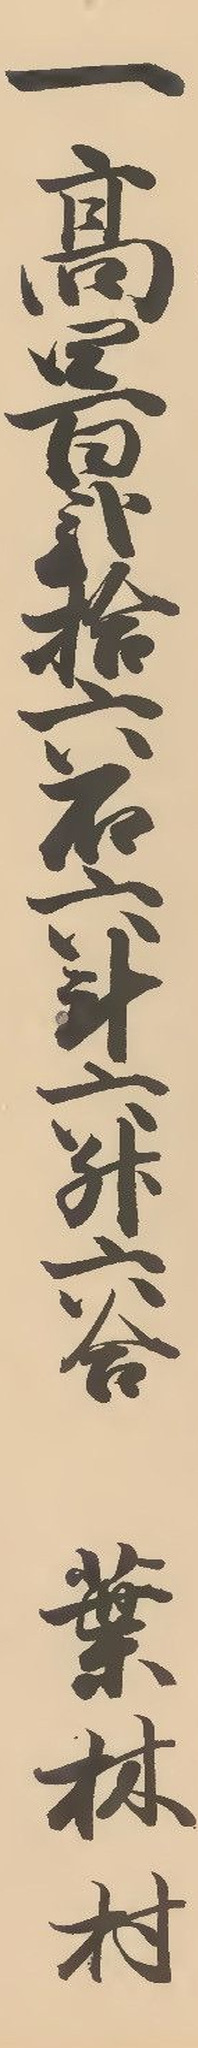一高四百弐拾六石六斗六升六合葉林村
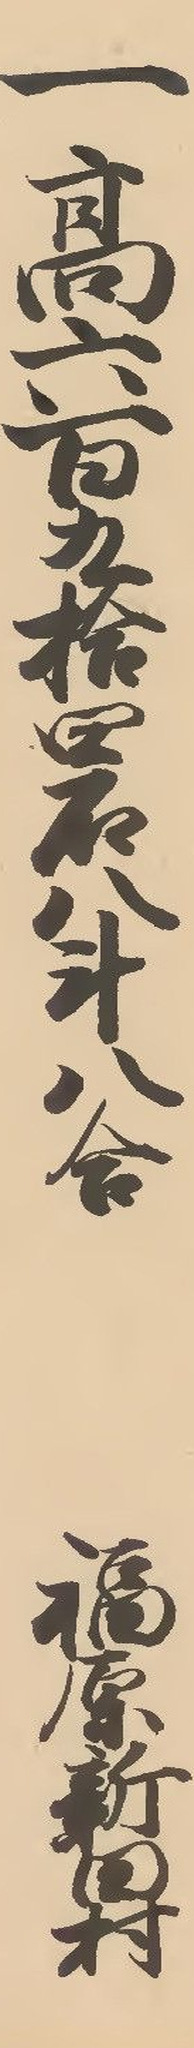一高六百九拾四石八斗八合福原新田村
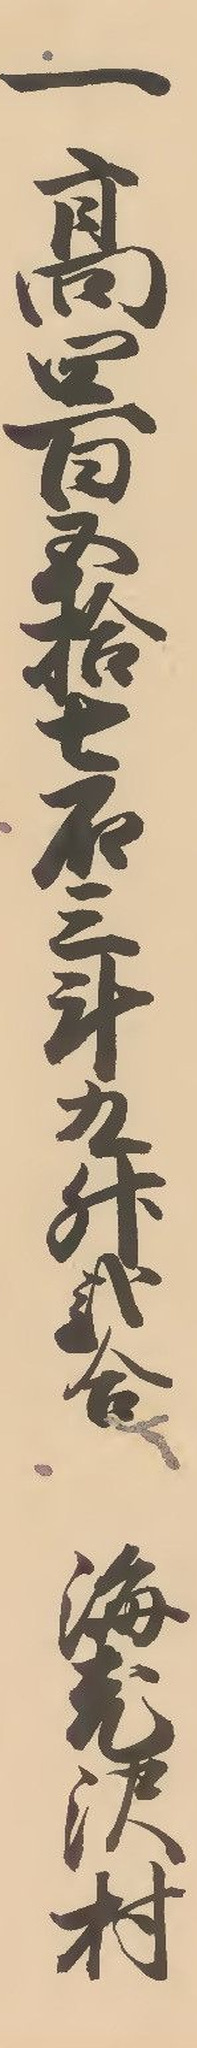一高四百五拾七石三斗九升弐合海老沢村

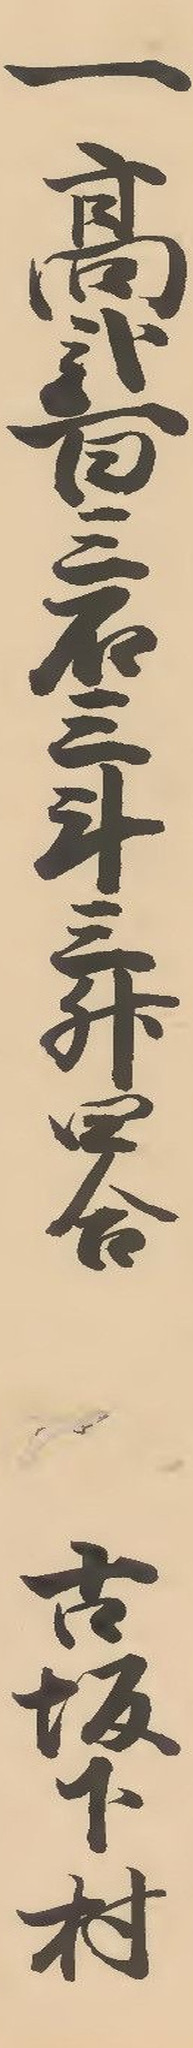一高弐百三石三斗三升四合古坂下村
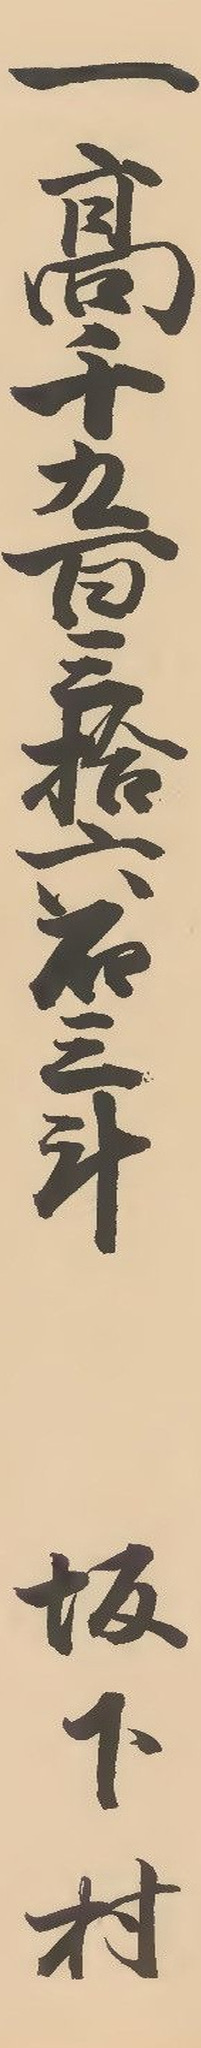一高千九百三拾六石三斗坂下村
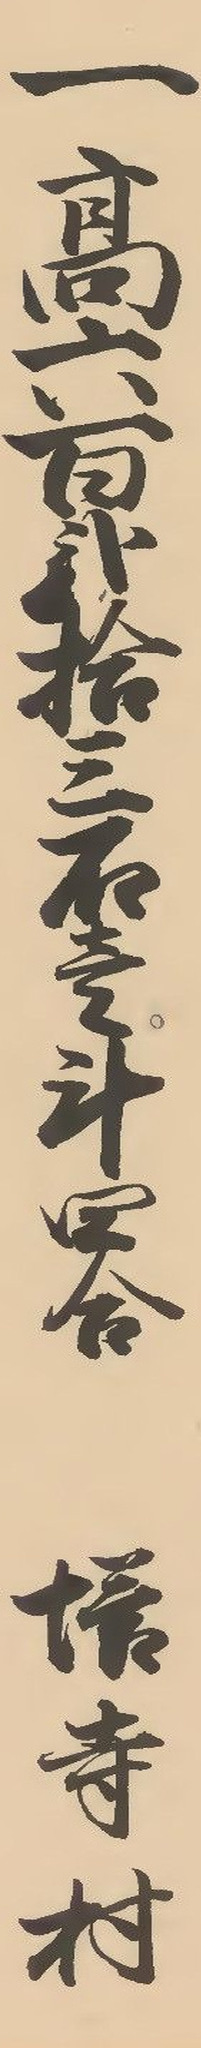一高六百弐拾三石壱斗四合塔寺村
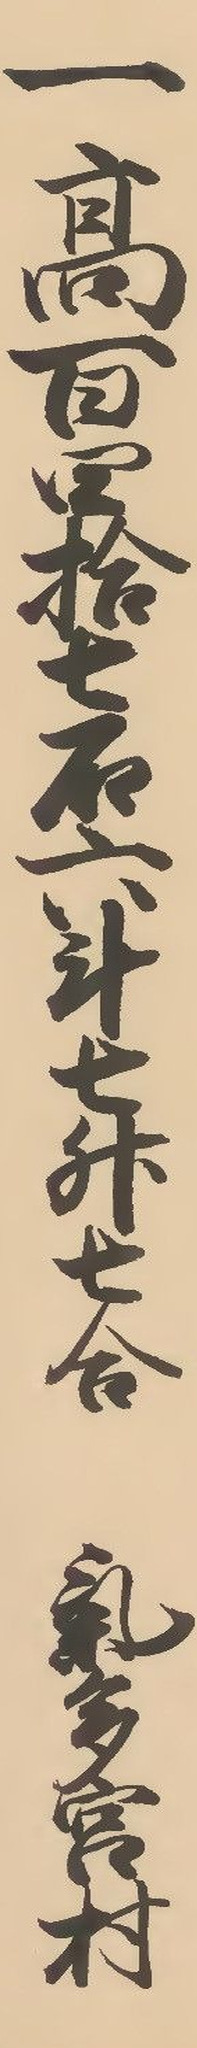一高百四拾七石六斗七升七合気多宮村
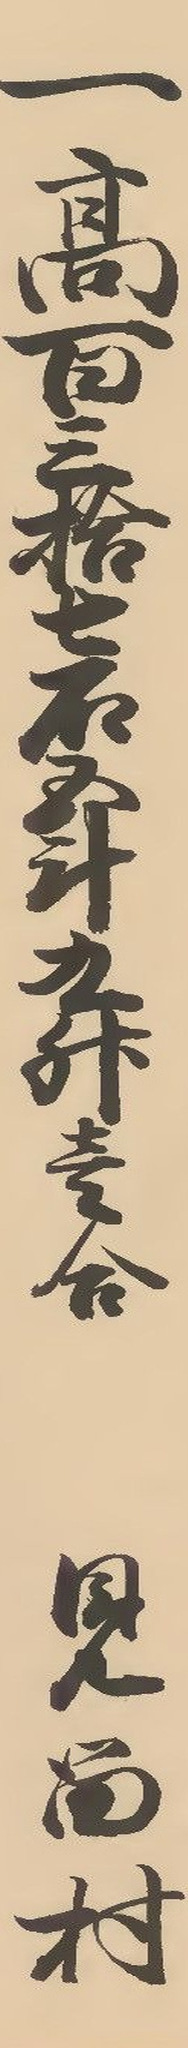一高百三拾七石五斗九升壱合見留村
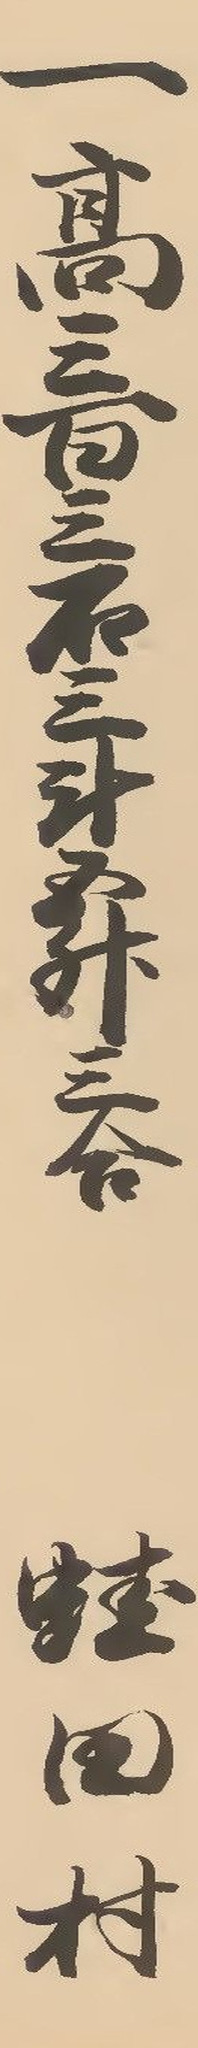一高三百三石三斗五升三合蛙田村
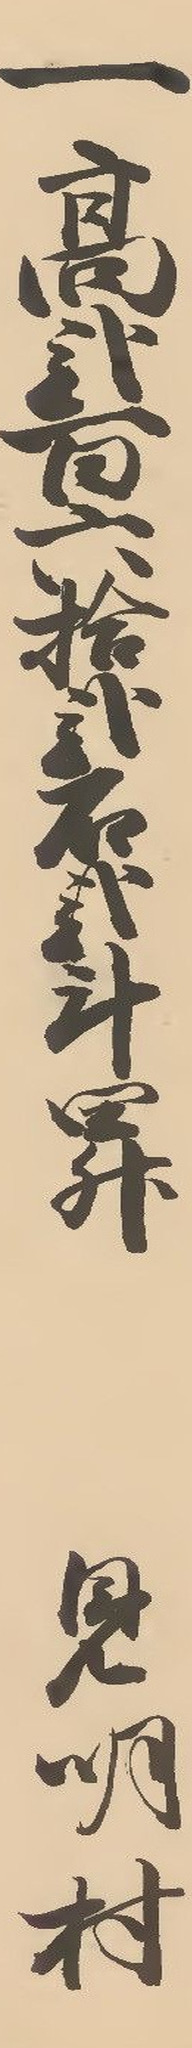一高弐百六拾弐石弐斗四升見明村
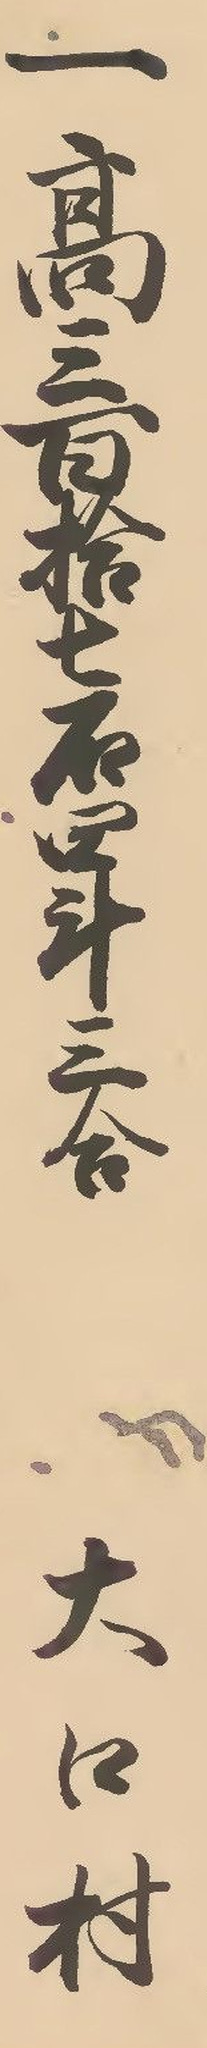一高三百拾七石四斗三合大口村

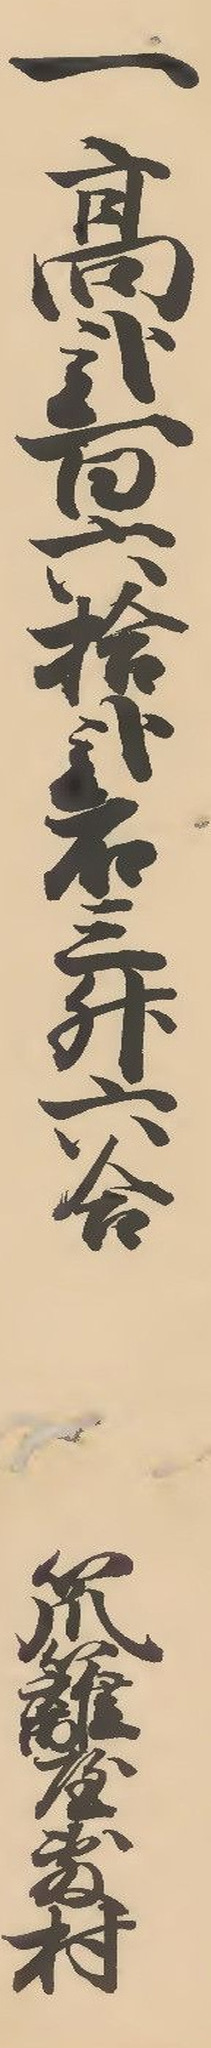一高弐百六拾弐石三升六合笊籬屋敷村
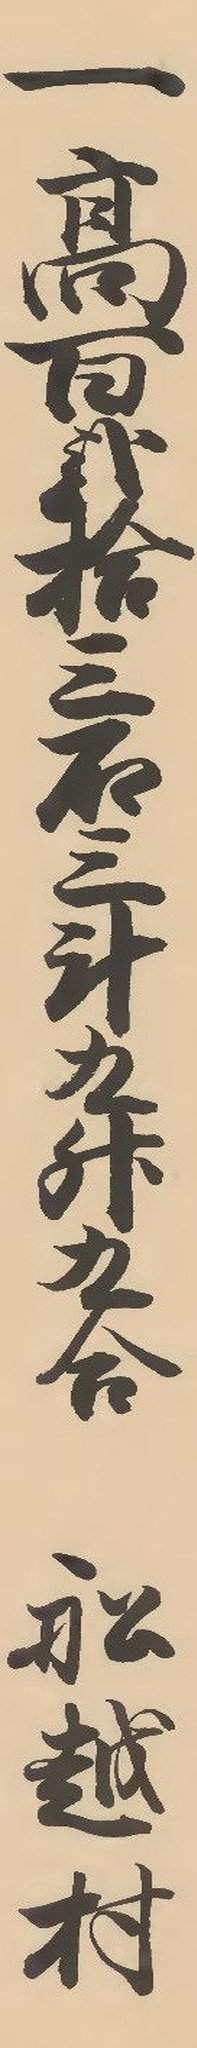一高百弐拾三石三斗九升九合船越村
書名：陸奥国郷帳　１
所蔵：国立公文書館 National Archives of Japan
